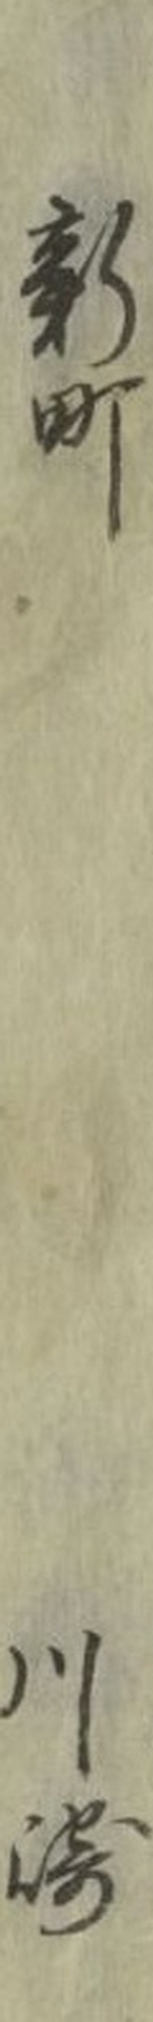新町川崎
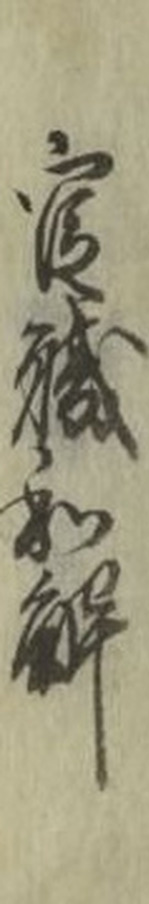官職和解
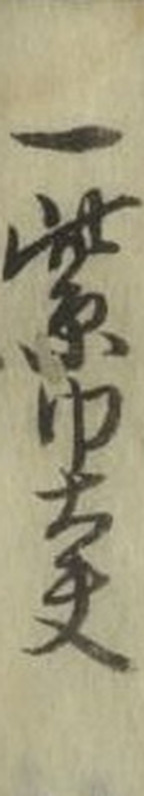一紫巾大夫
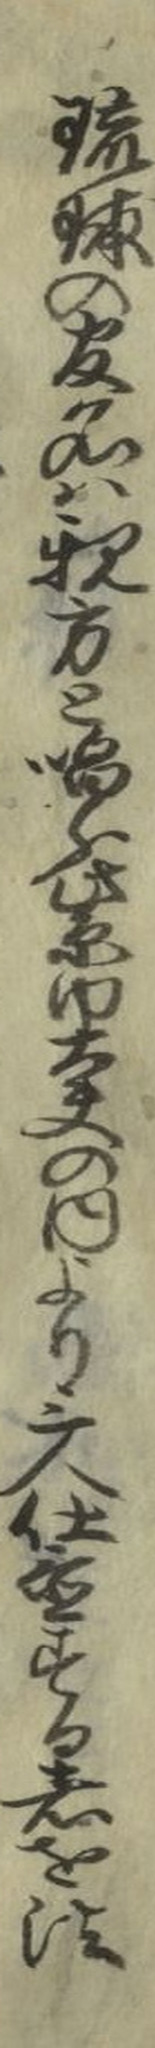琉球の官名は親方唱ふ紫巾大夫の内より三人仕置する者を法
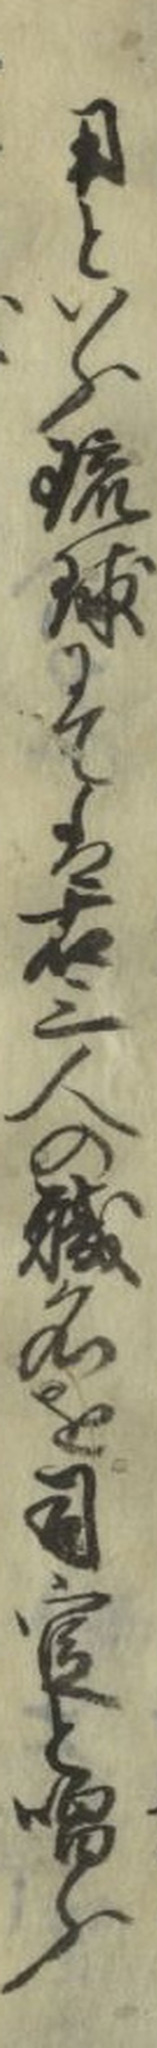用といふ琉球にては右三人の職名を司官と唱ふ
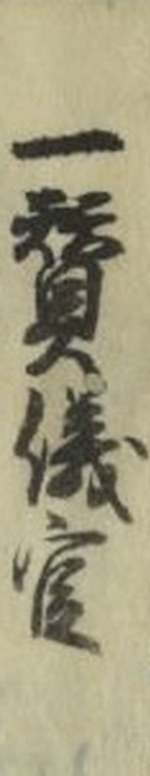一賛儀官
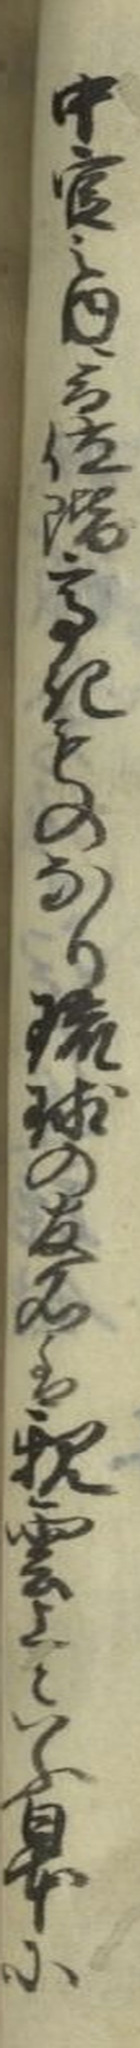中官之内にて位階高きものなり琉球の官名は親雲上といふ日本に
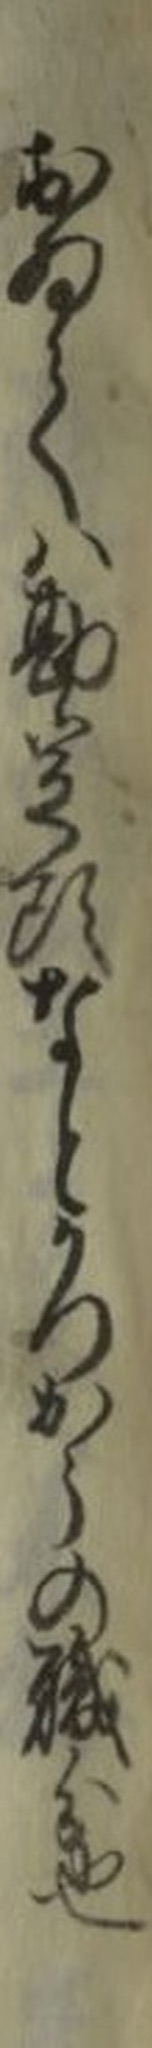おいては勘定頭なとか門からの職分也
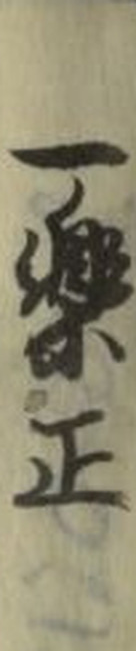一楽正
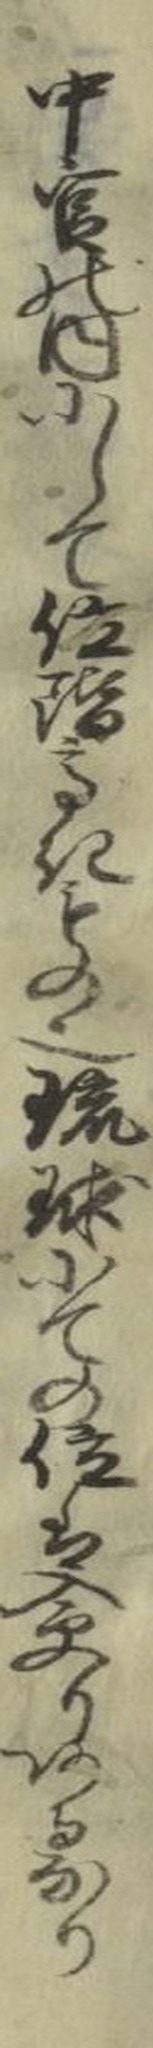中官之内にして位階高きもの也琉球にての位は入更りあるなり
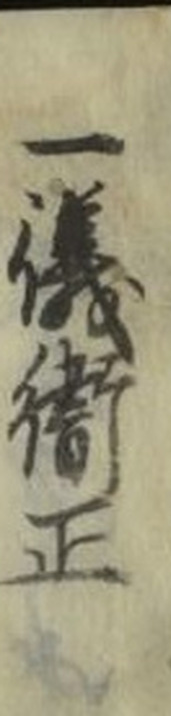一儀衛正
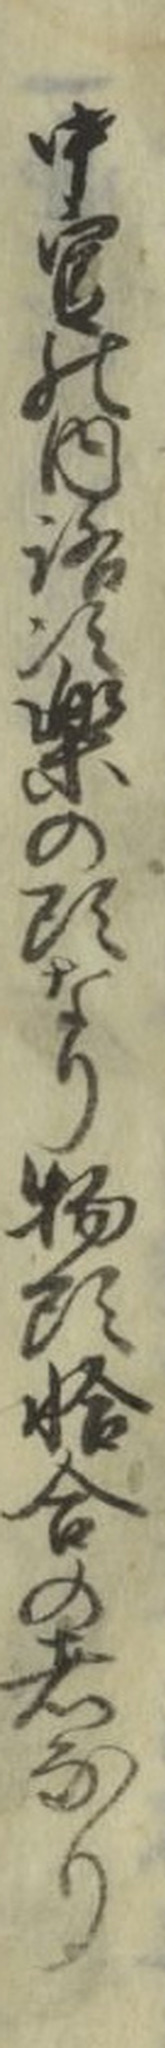中官之内路次楽の頭なり物頭恰合の者なり
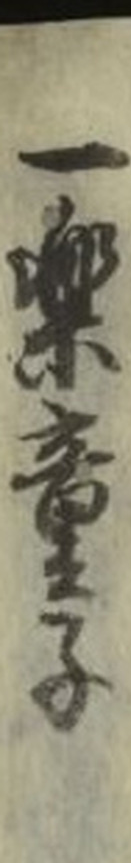一楽童子
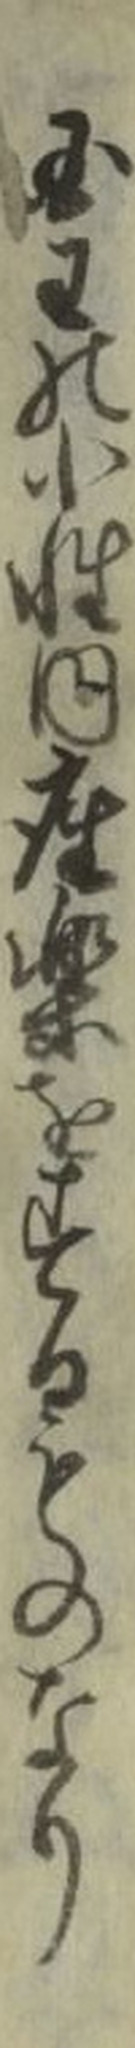国王の小姓内座楽をするものなり
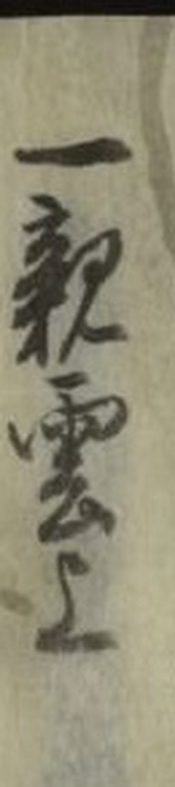一親雲上
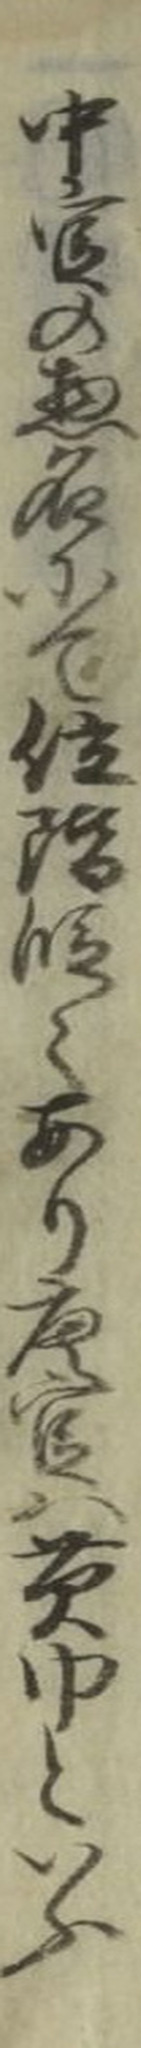中官の惣名にて位階段々あり唐官は黄巾といふ
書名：琉球人来朝之記
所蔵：University of the Ryukyus Library
